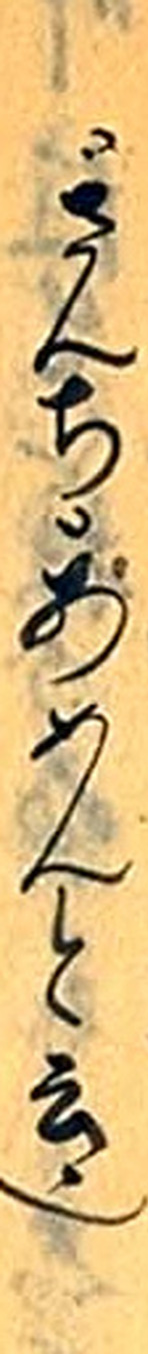◦さんち◦あめんと云也
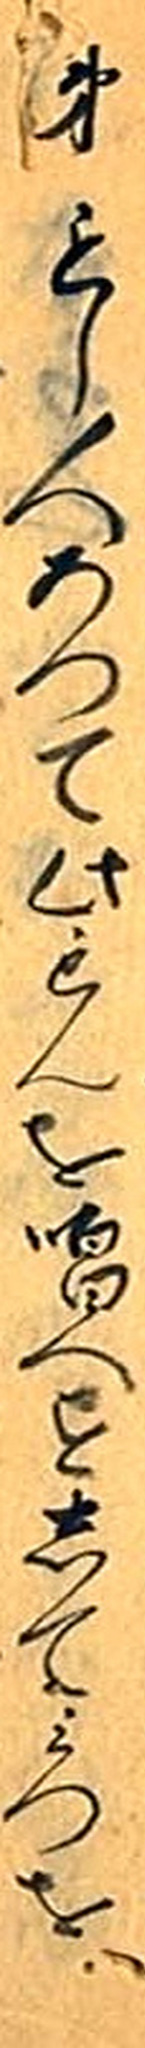弟もし人あつてこのもんを唱へすしてみつを
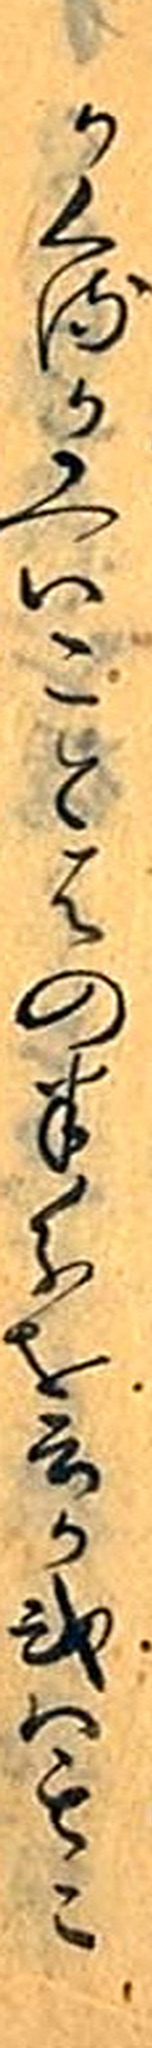かくるか又はことはの半分を云か或は其こ
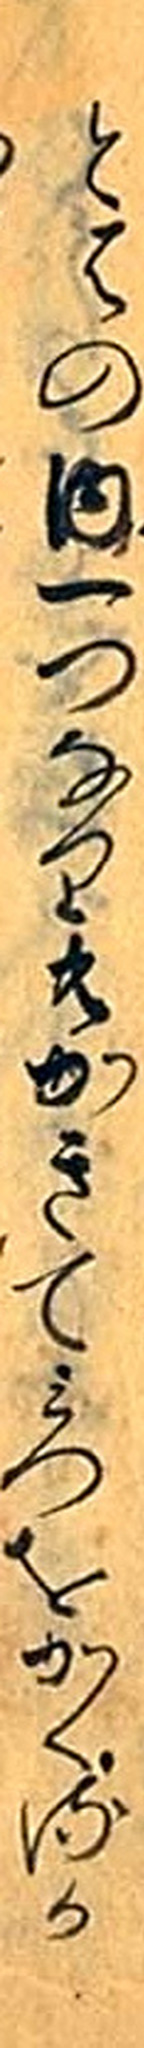とはの内一つなり共かきてみつをかくるか
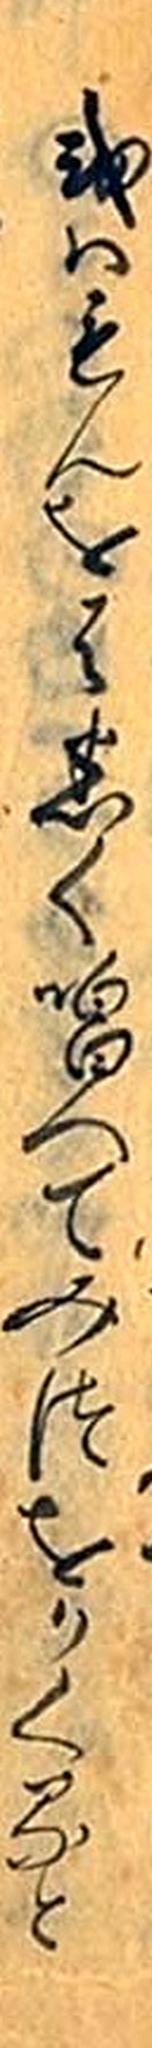或はもんをは悉く唱へてみつをかくると
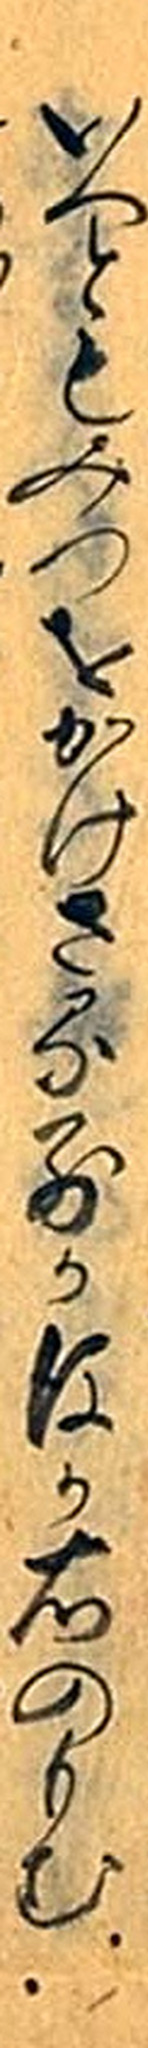いへともみつをかけさる前か後か右のもむ
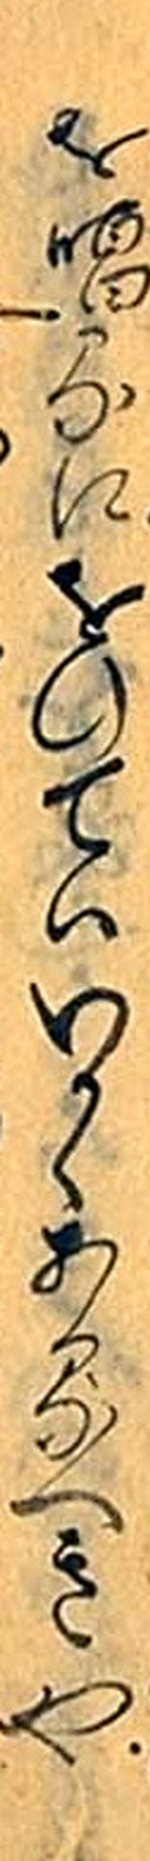を唱るにをひてはいかゝあるへきや
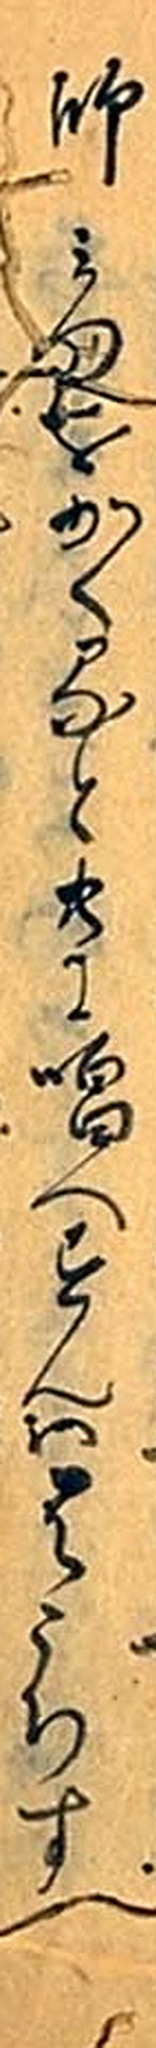師みつをかくると共に唱へすんははうちす
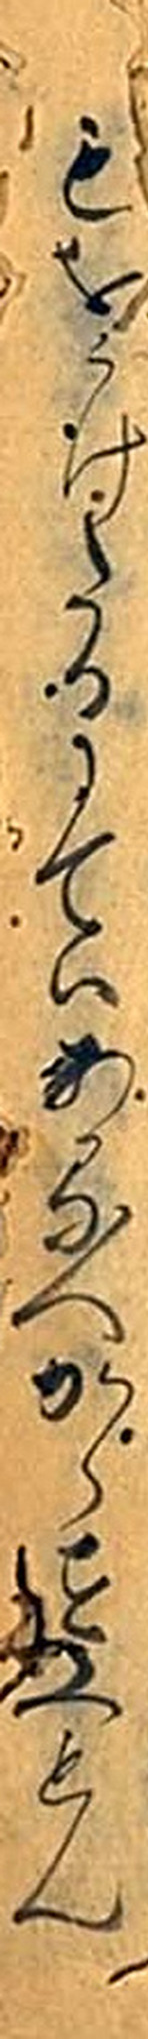もをうけたるにてはあるへからす又もん

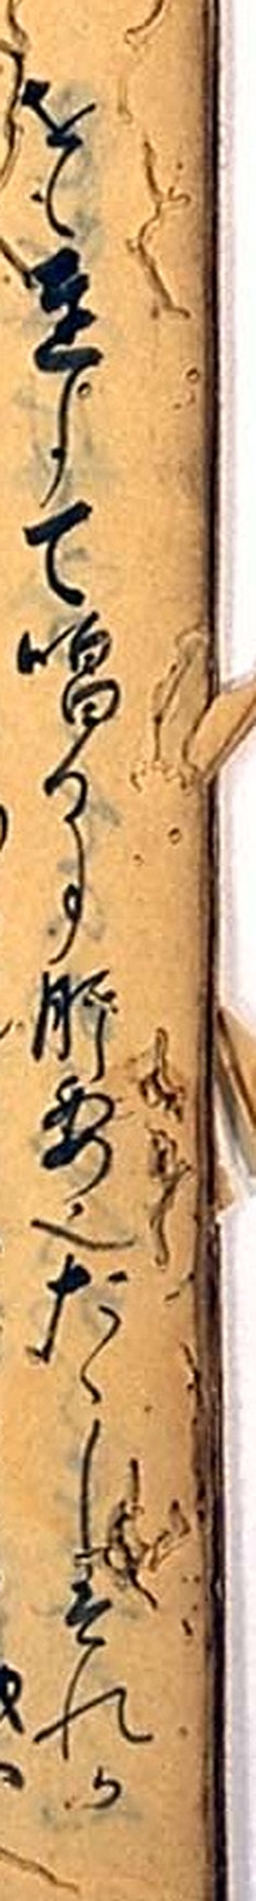をも達して唱る事肝要也たゝしそれか
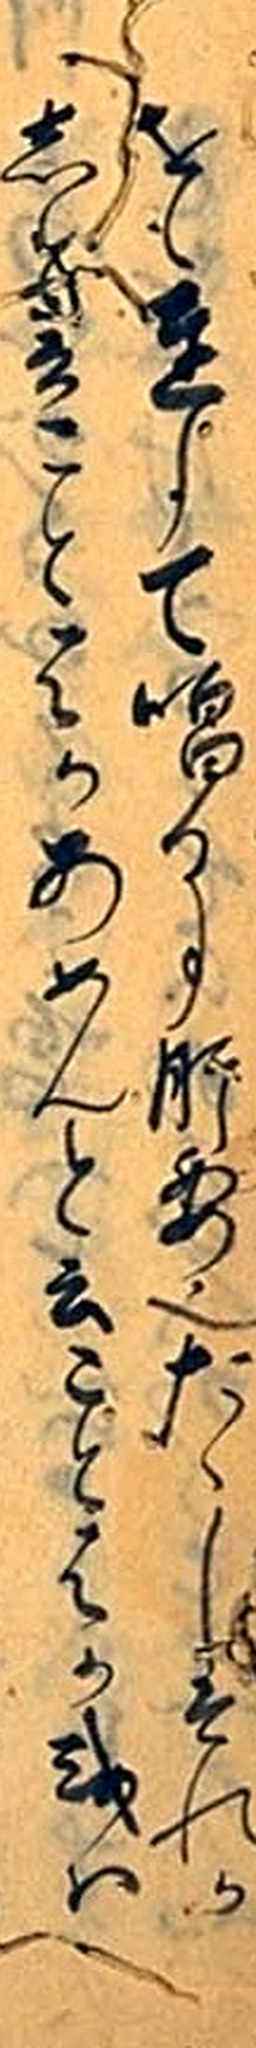し云ことはかあめんと云ことはか或は
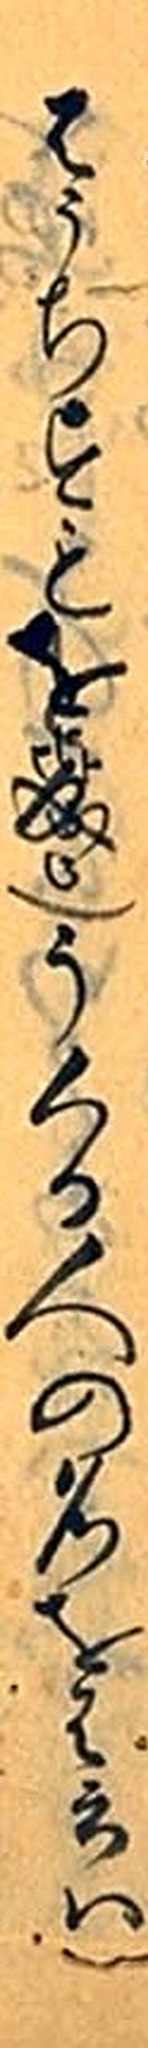はうちすもを成也うくる人の名をは云は
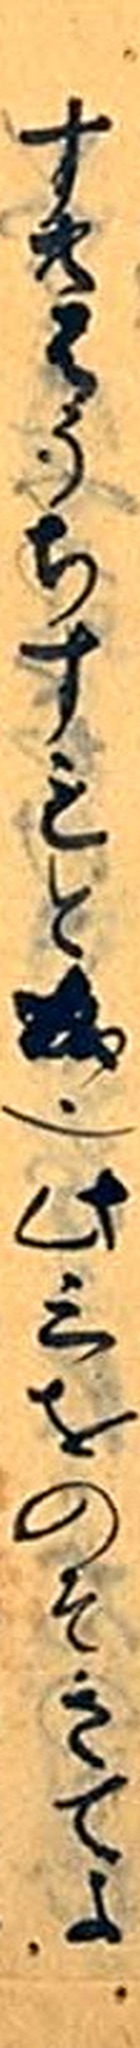す共はうちすもと成也此三をのそきてよ
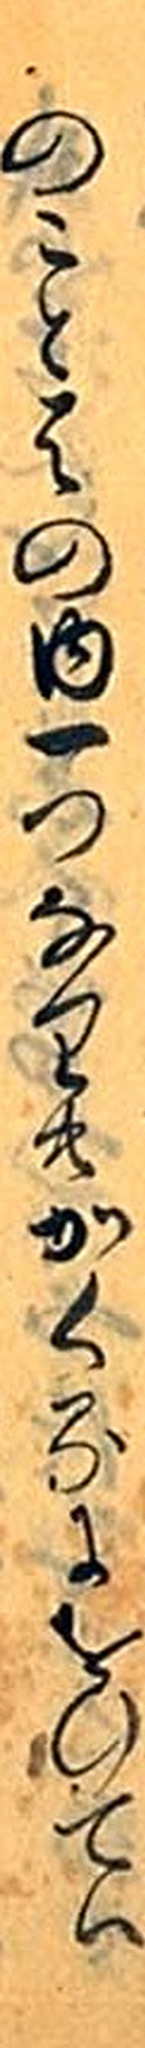のことはの内一つなり共かくるにをひては
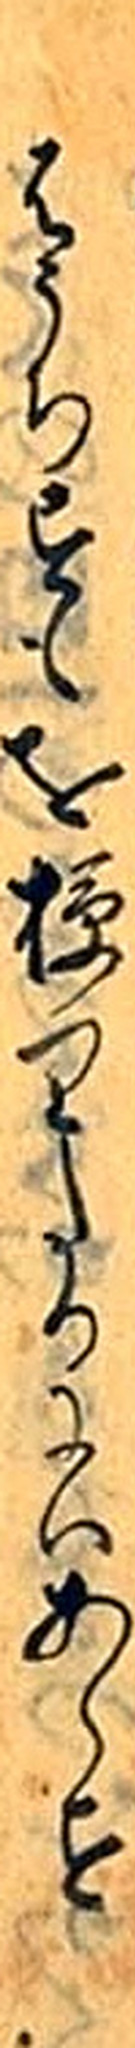はうちすもを授りたるにはあらす
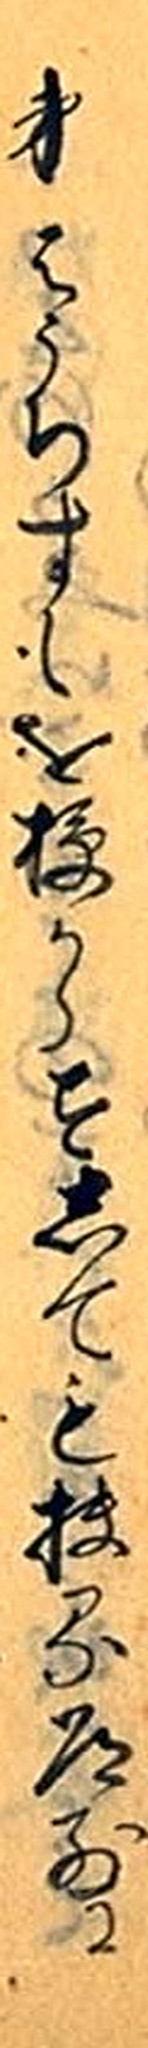弟はうちすもを授からすしても扶る道別に
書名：ドチリナ・キリシタン
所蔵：東京大学総合図書館 / General Library in the University of Tokyo
